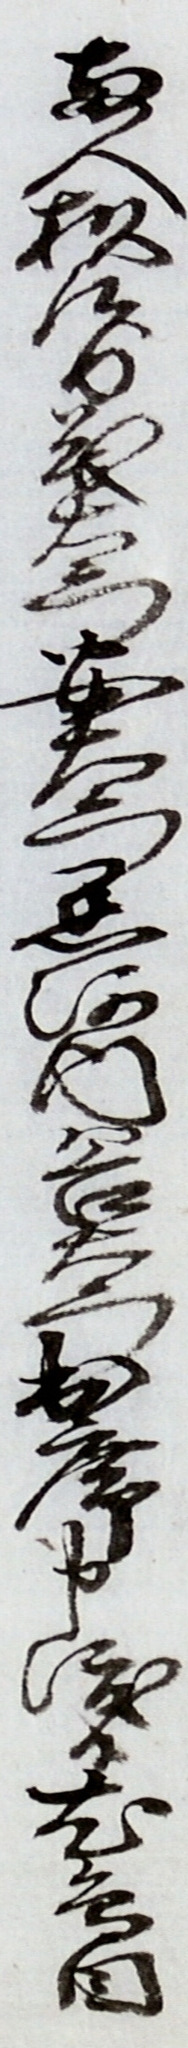両人杉左衛門義右衛門安右衛門黒河内善右衛門出席申渡候尤鳥目
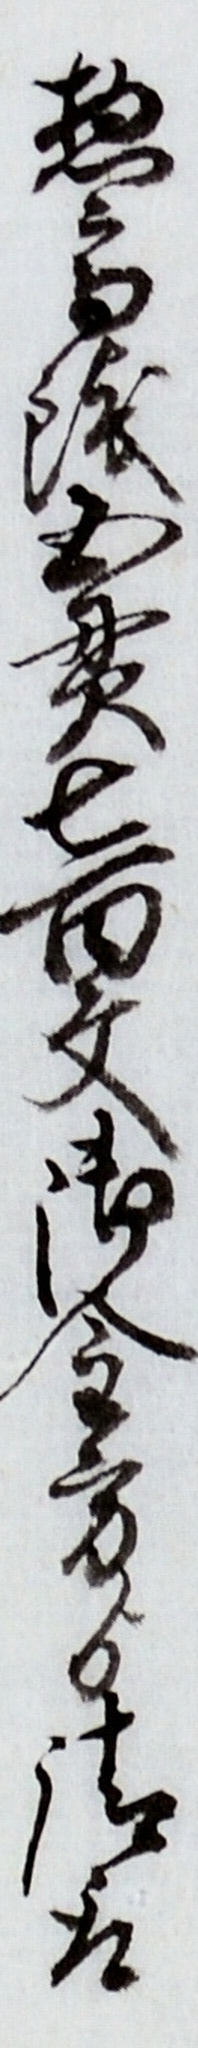惣高銭五貫七百文御金方より請取
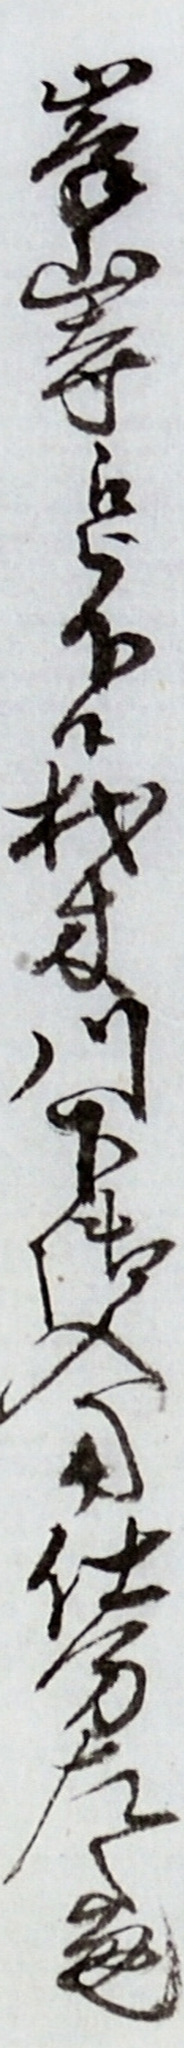峯山寺江被下候材木川下御入用仕分左之通
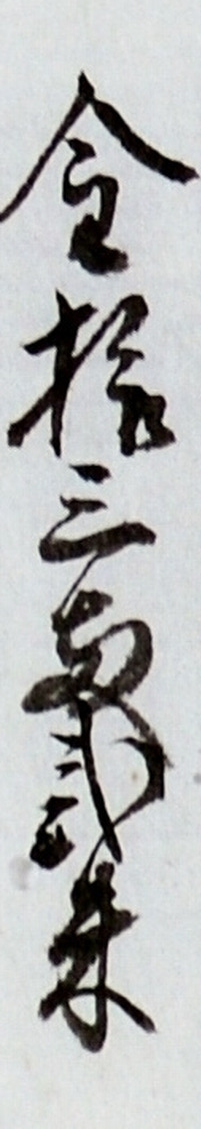金拾三両弐朱
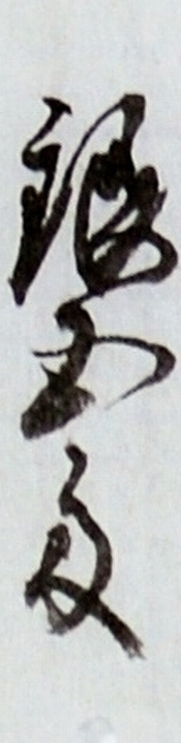銀五匁

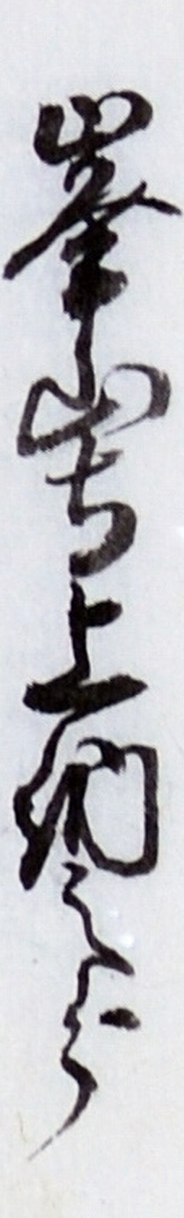峯山寺上納之分
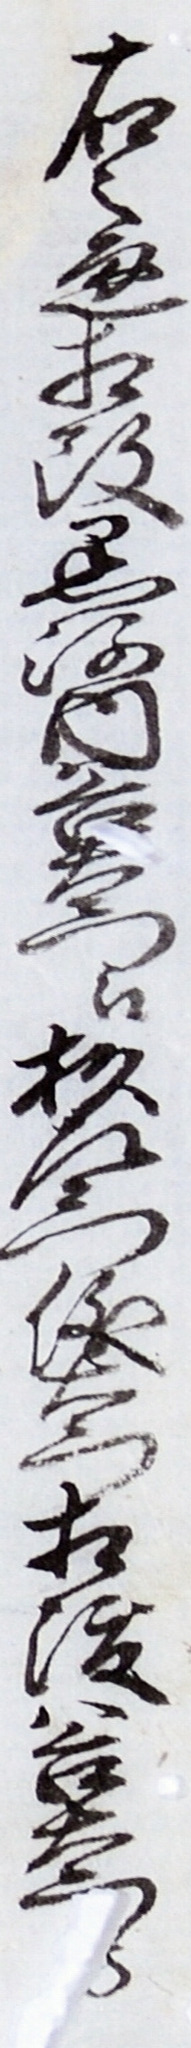右之通相改黒河内善右衛門江杉左衛門儀右衛門相渡善右衛門
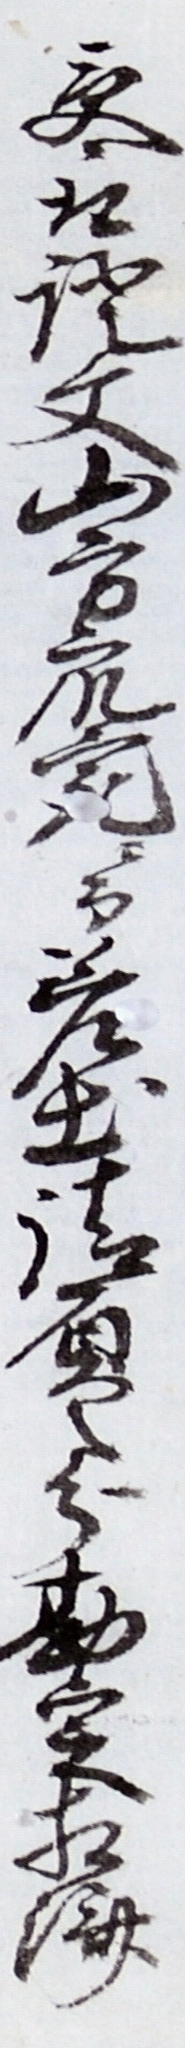受取証文山方衆宛ニ而差出請負之分勘定相済
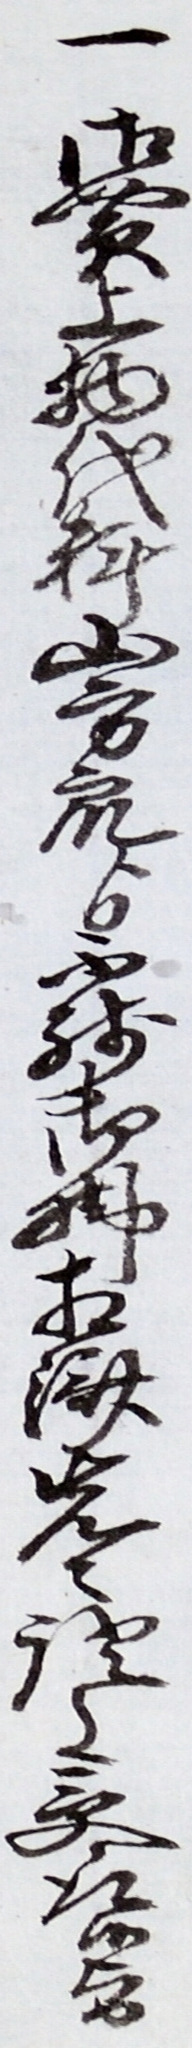一御買上納代料山方衆より不残御払相済先々証文受取候旨
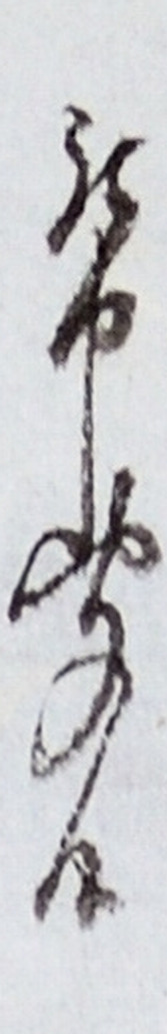被申聞候
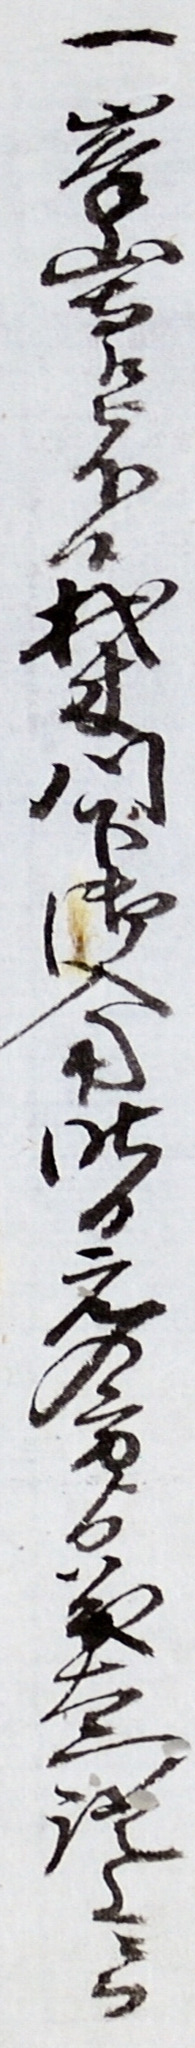一峯山寺江被下候材木川下御入用昨日元〆方より義右衛門証文ニ而
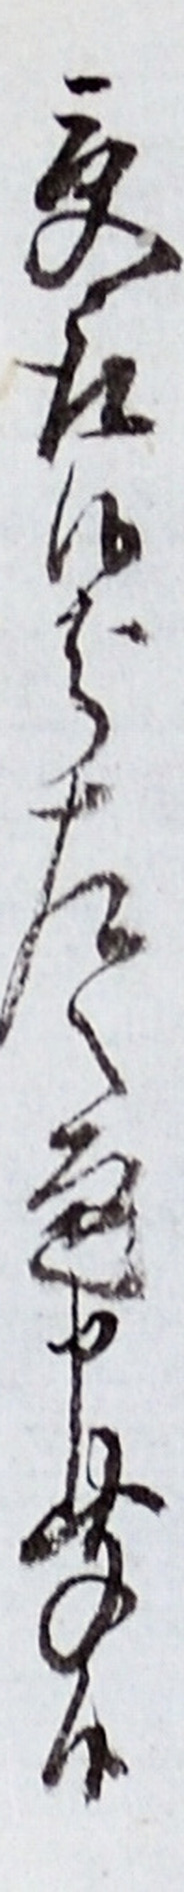受取候分左之通申聞候
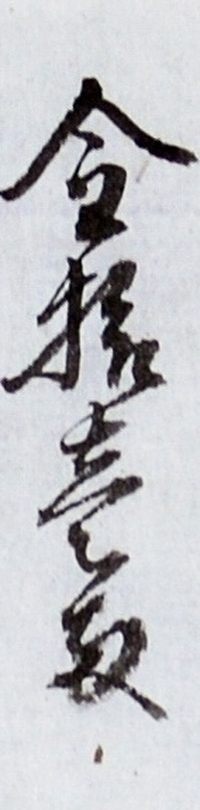金拾壱両
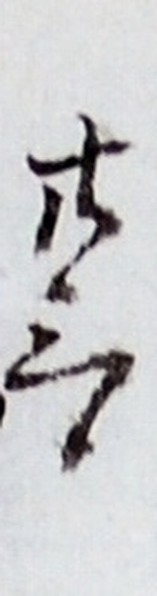廿三日
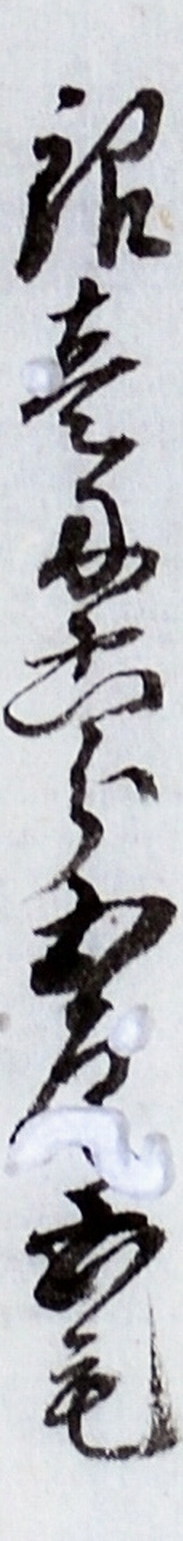銀壱匁六分五百五毛
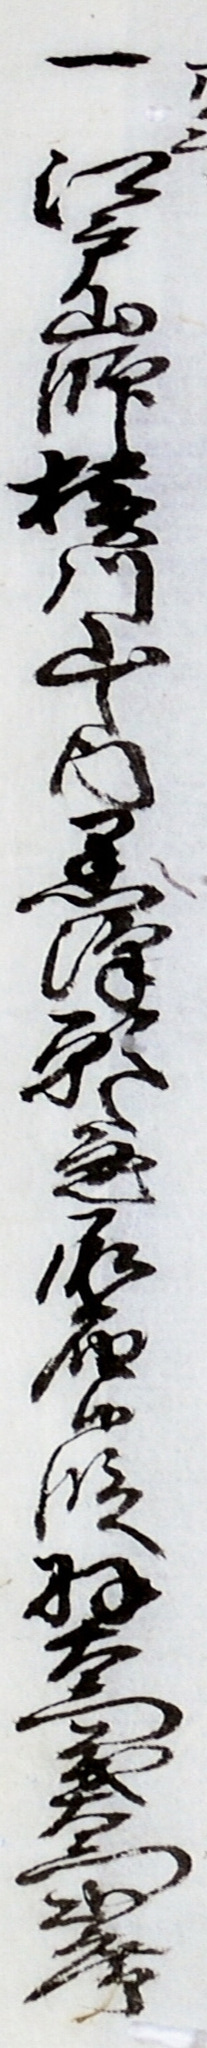一江戸山師横川山之内黒澤願之通承届候段羽右衛門義右衛門出席
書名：御山奉行御用控
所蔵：伊那市立高遠町図書館・合同会社AMANE
